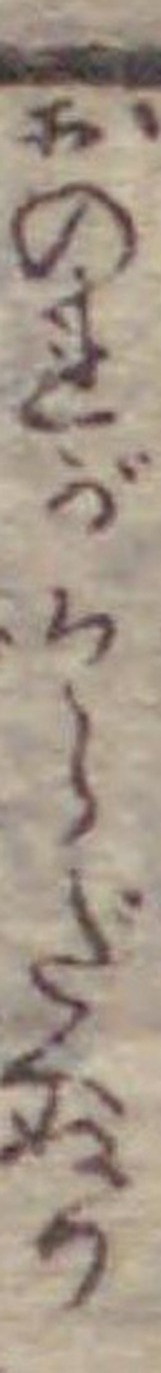おのれがからだへぬり
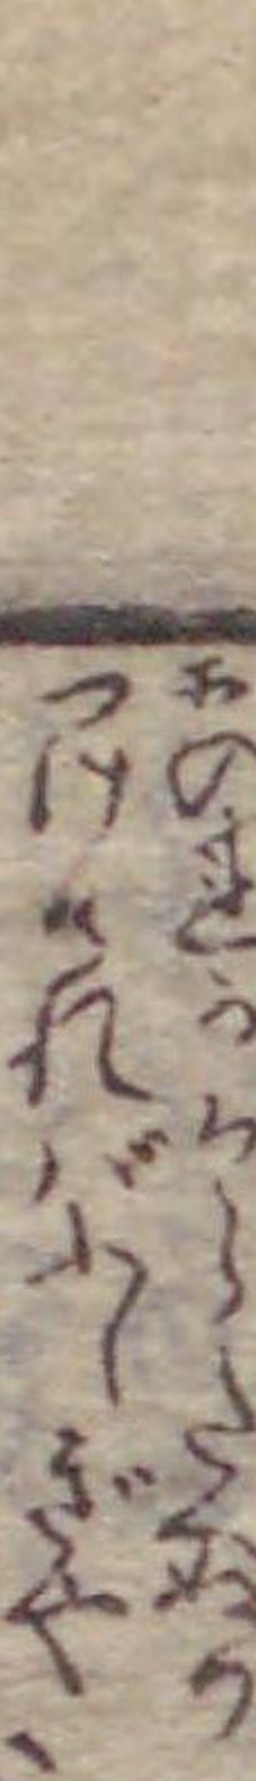つけければふしぎや
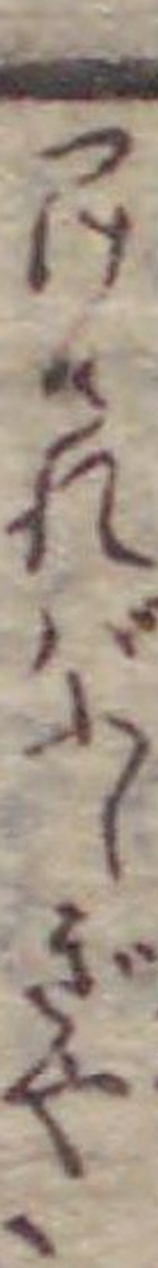つけければふしぎや
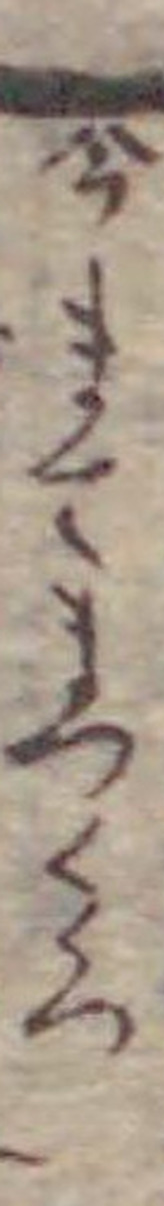今まてまつくろ
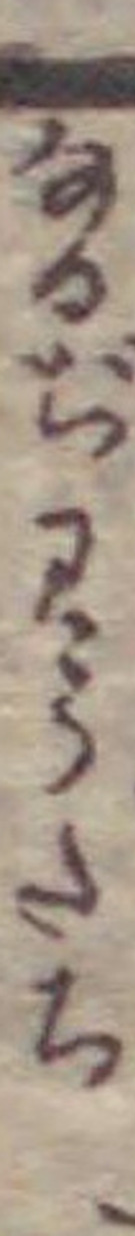なるぢわうたち
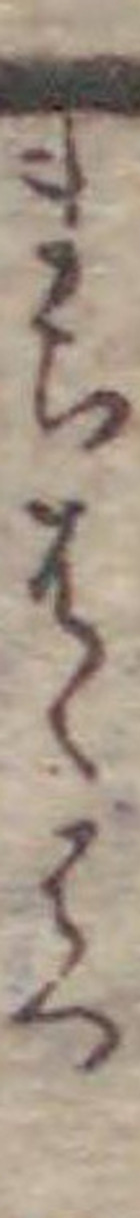まちはくはつ
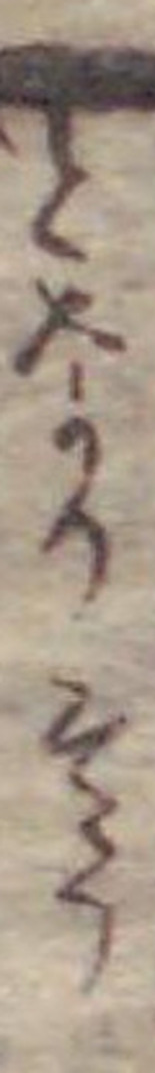となりそう
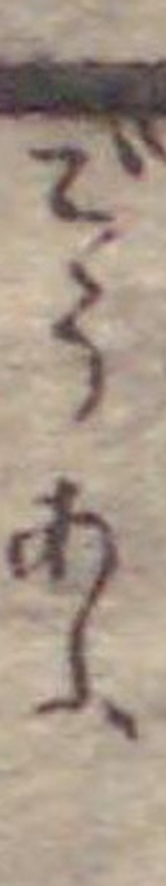でうあふ
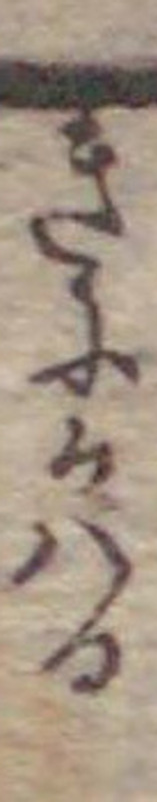きにかはる

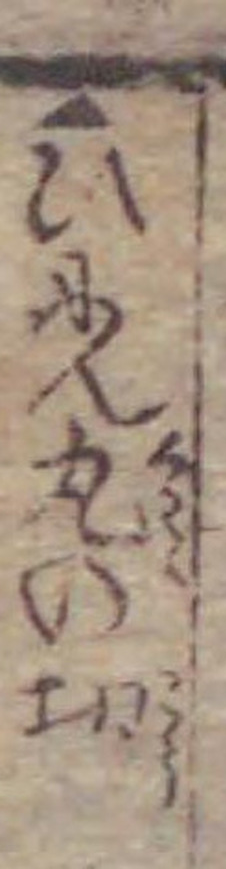▲ひにん丸の功
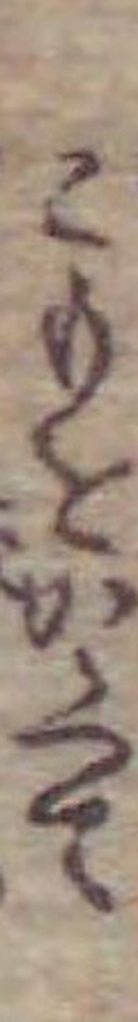こもをかゝつて
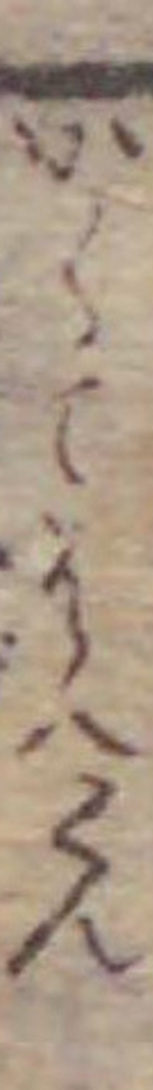かくてはんこん
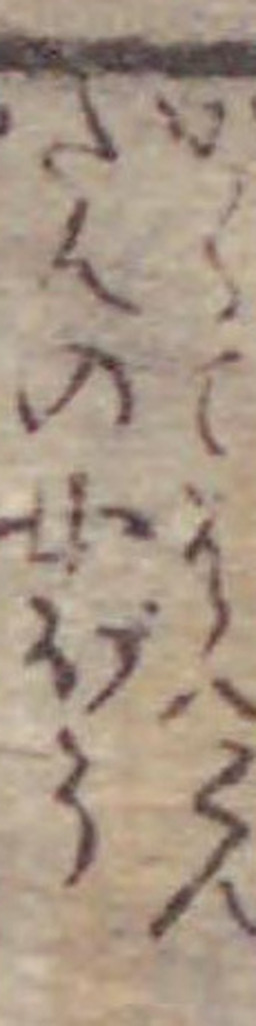たんの女ぼう
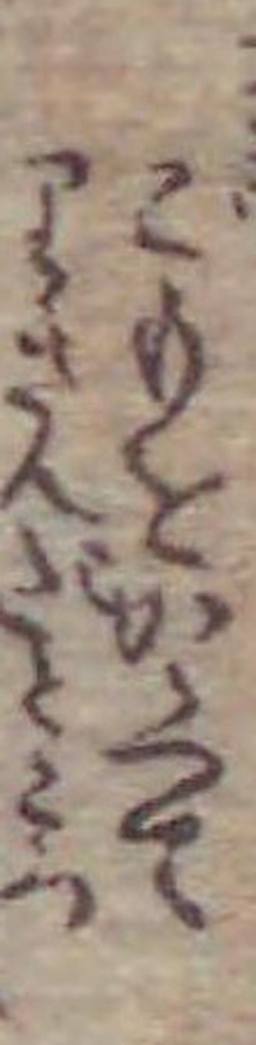りきんだところ
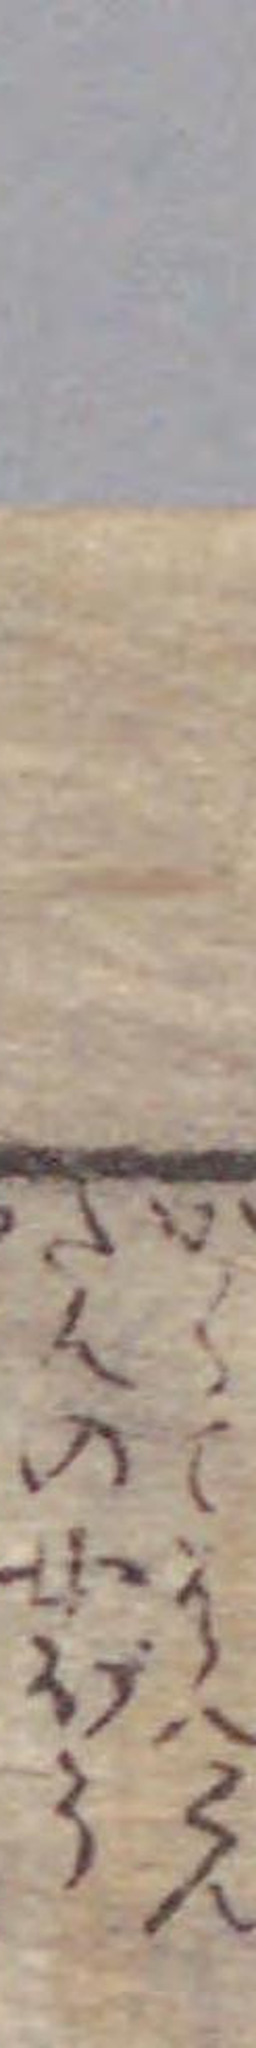たんの女ぼう
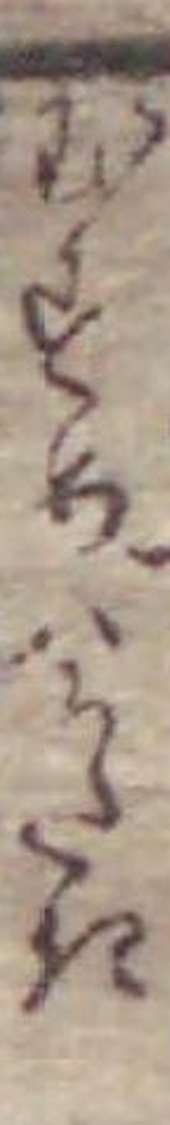むすめはかたき
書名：鼻下長生薬 : 3巻
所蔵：国立国会図書館 National Diet Library, JAPAN
